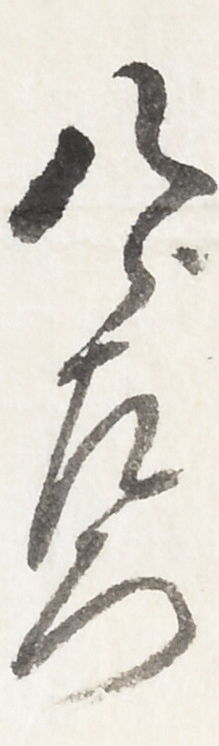八郎左衛門
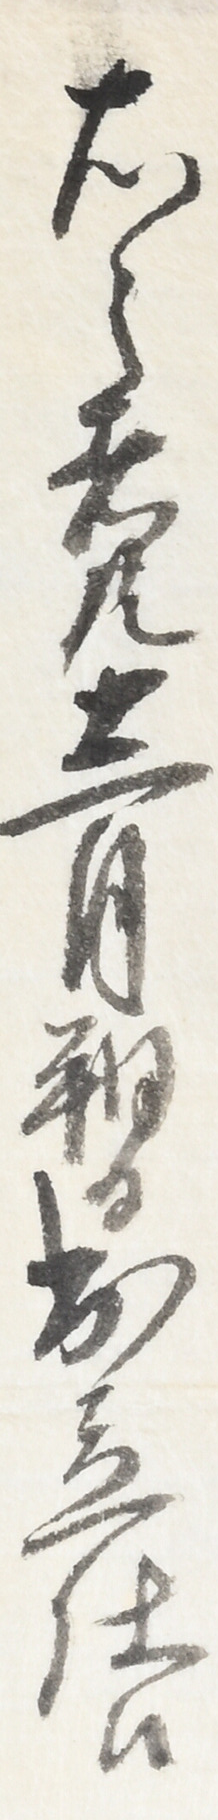右之者共十二月朔日出立仕候
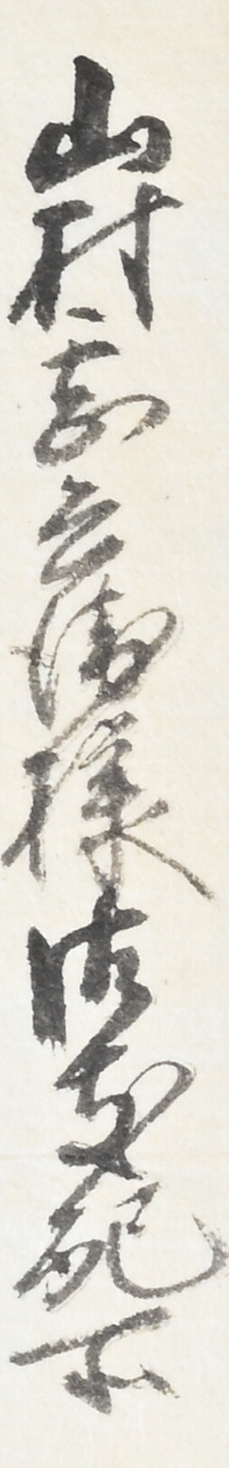山村甚兵衛様御支配所
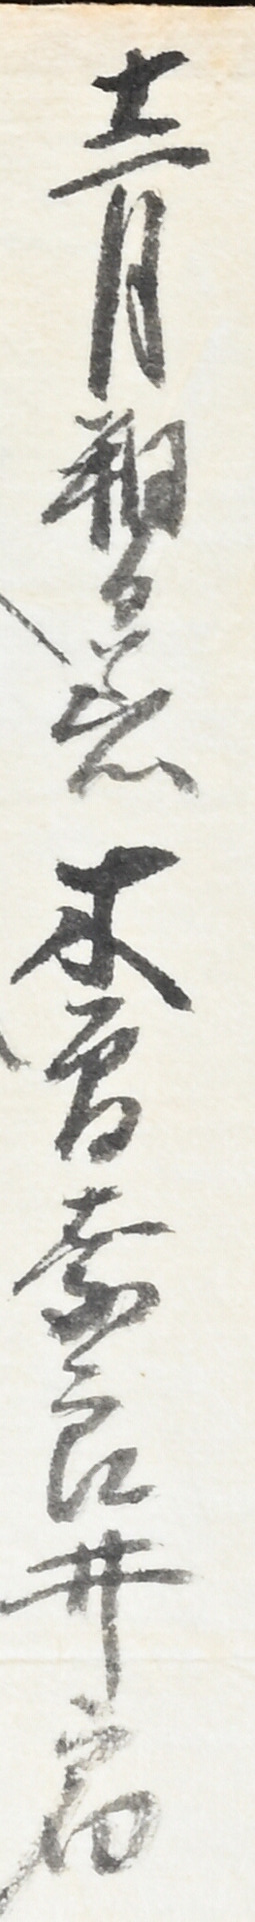十二月朔日着木曽奈良井宿
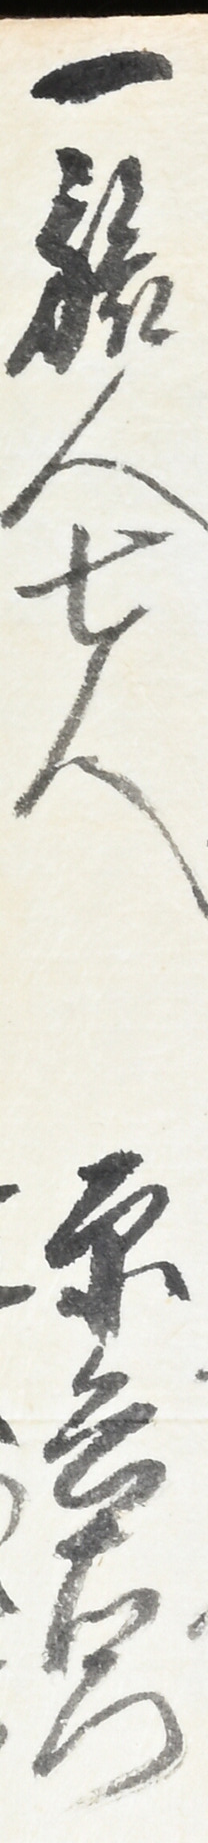一旅人七人原兵右衛門
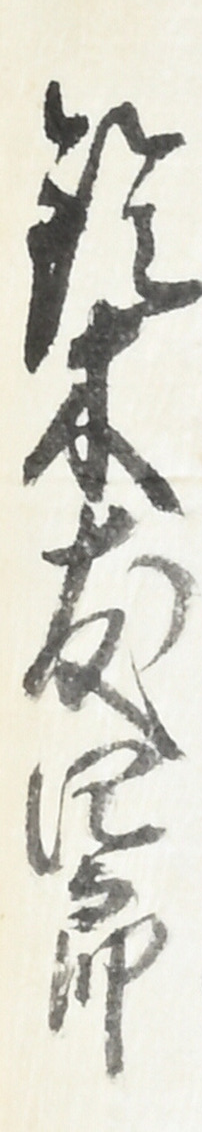鈴木友四郎
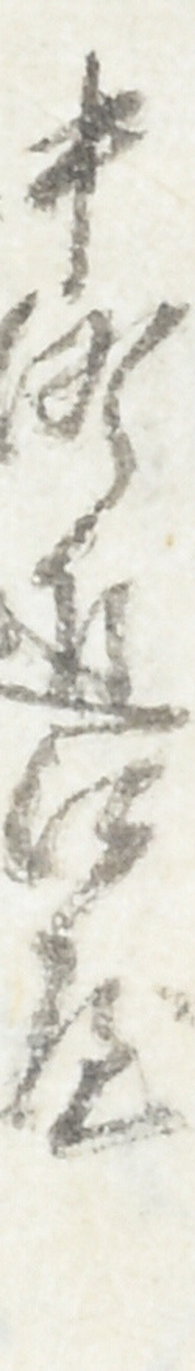中町近江屋

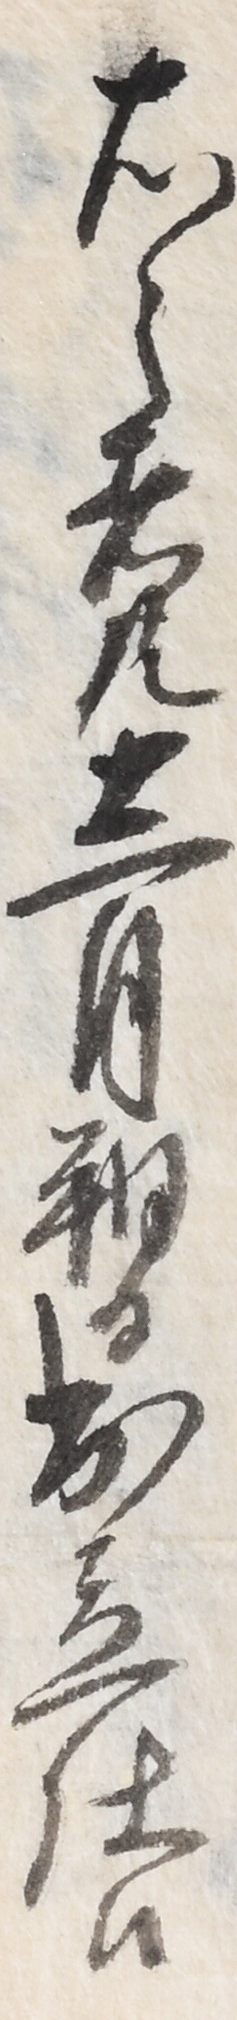右之者共同六日出立仕候
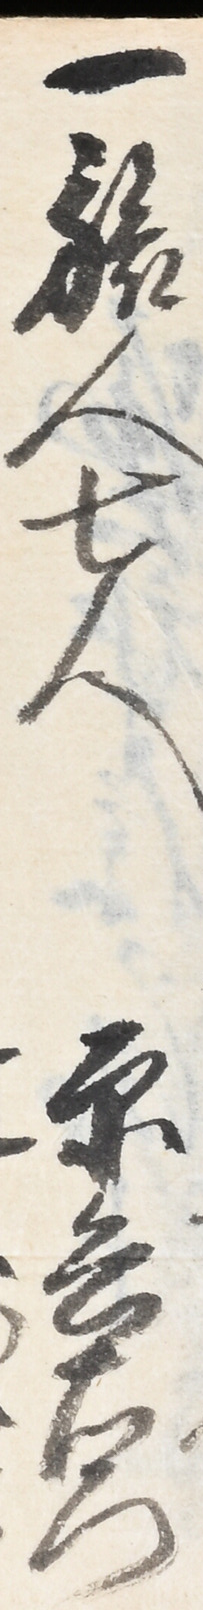一旅人壱人松屋安右衛門
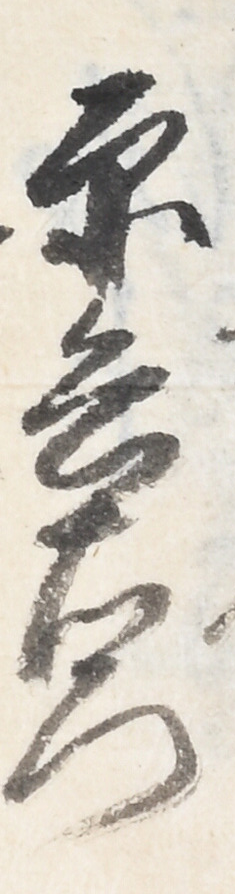宿金右衛門
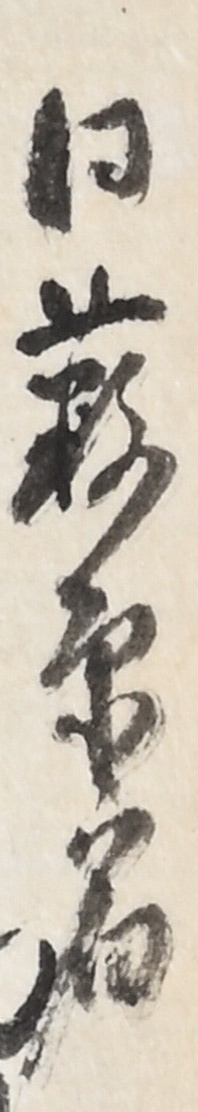同藪原宿
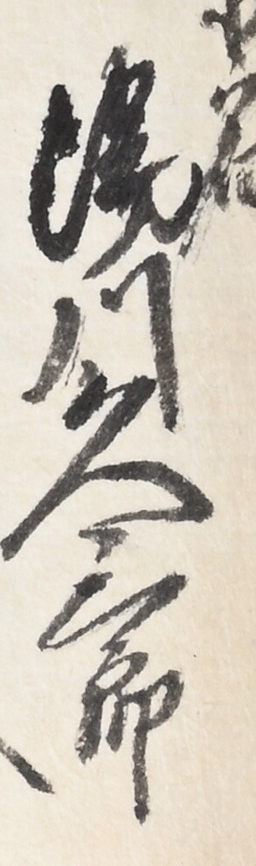湯川久三郎
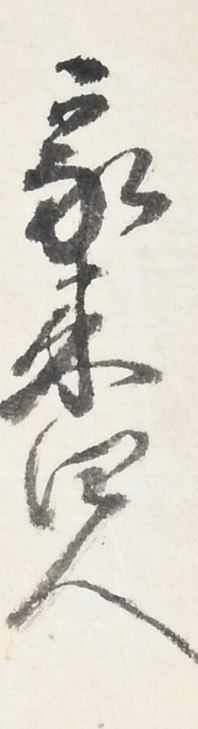家来四人
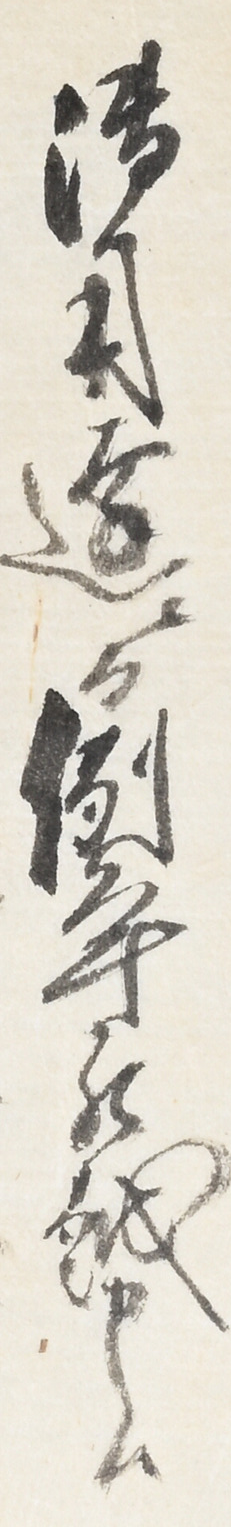御用達ニ而例年罷越申候
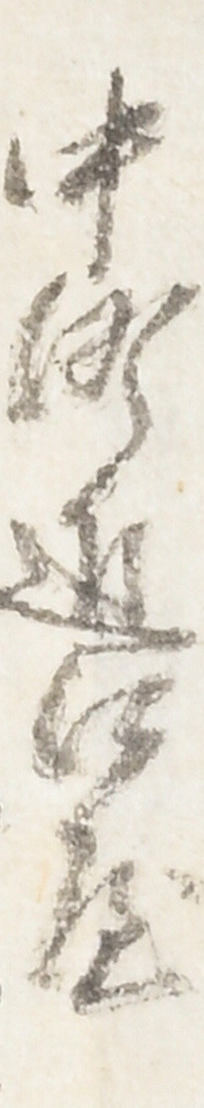中町近江屋
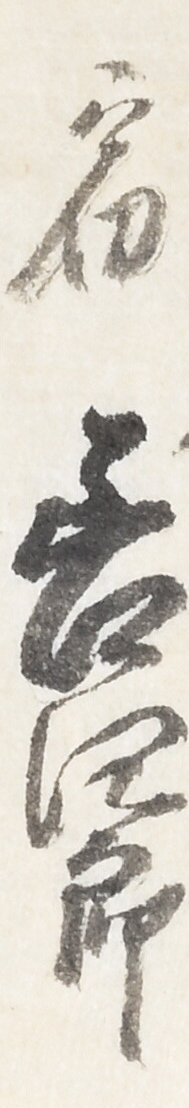宿善四郎
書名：旅人泊控帳
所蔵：伊那市立高遠町図書館・合同会社AMANE
